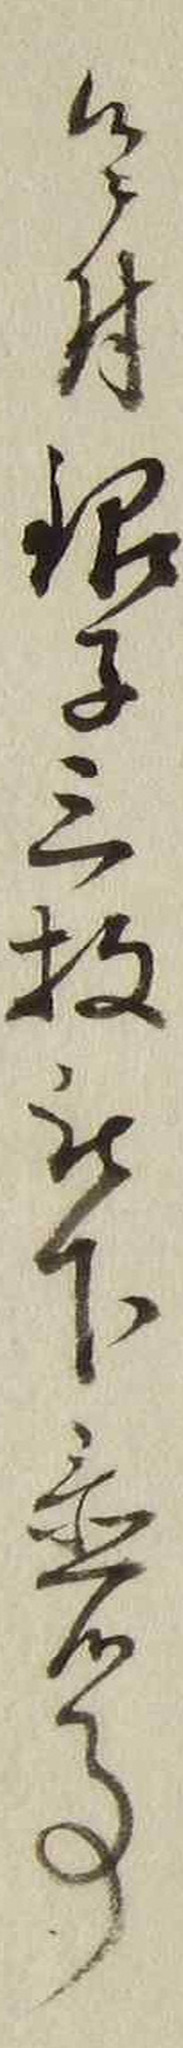候ニ付銀子三枚被下置候事

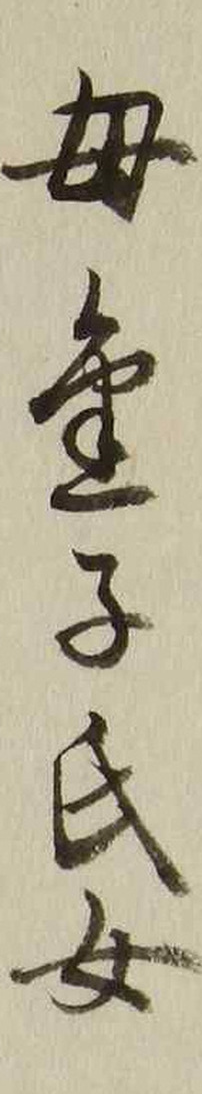母金子氏女
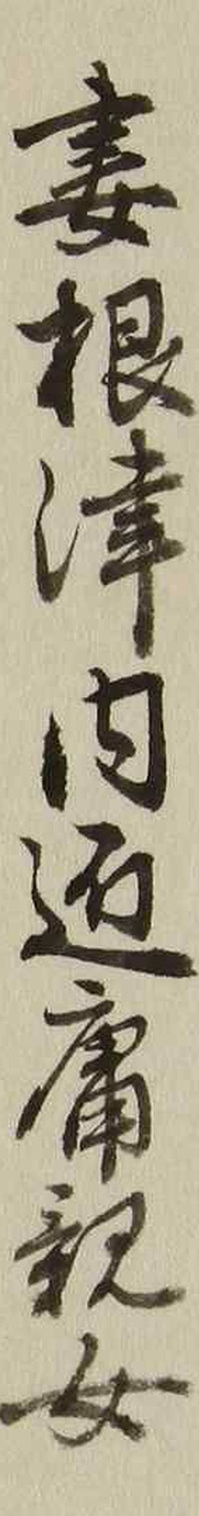妻根津内近庸親女
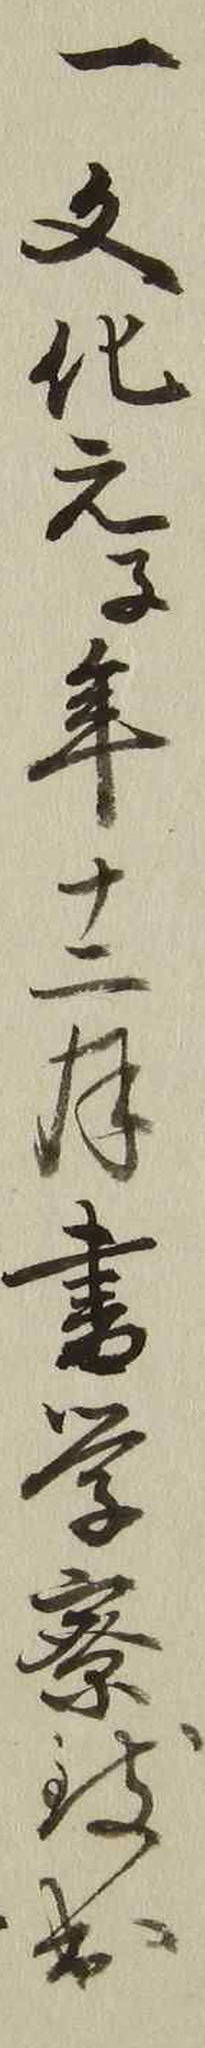一文化元子年十二月書学寮致出
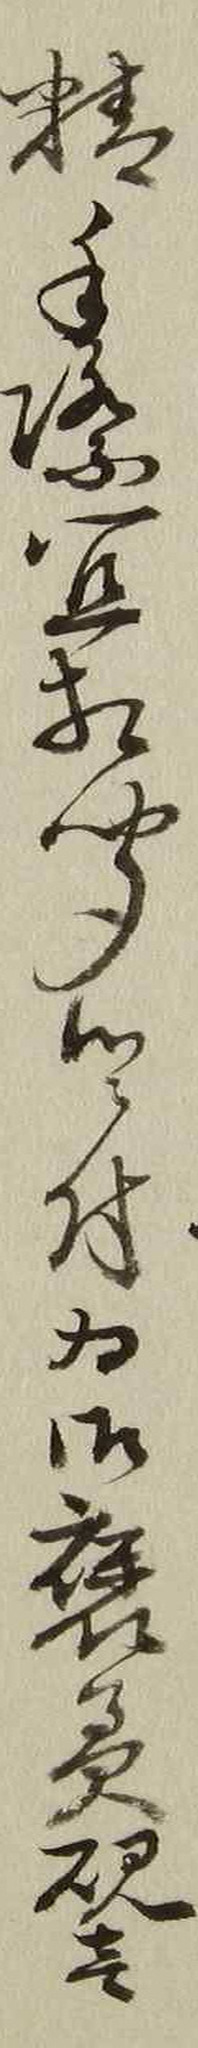精手際宜相聞候ニ付為御褒美硯壱
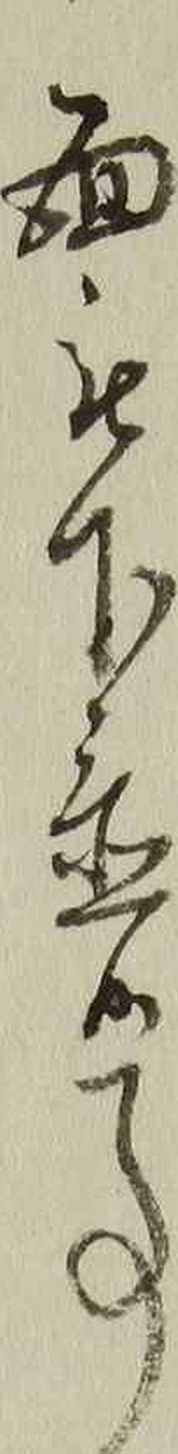面被下置候事
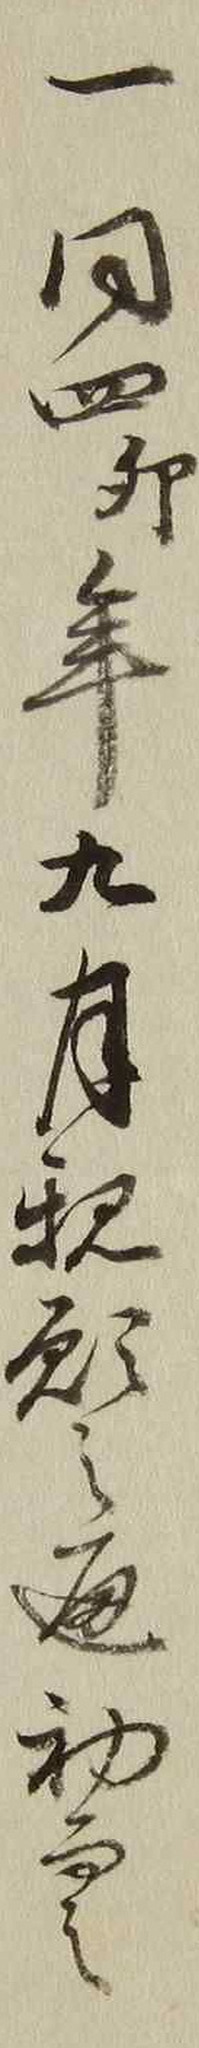一同四卯年九月親願之通初而之
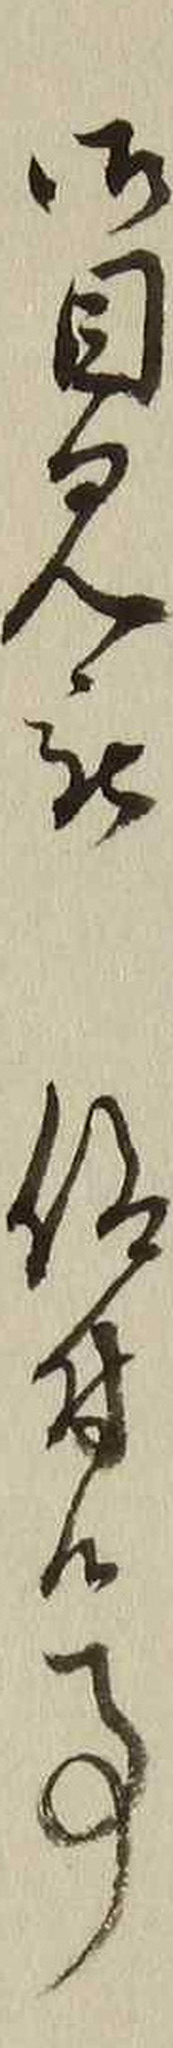御目見被仰付候事
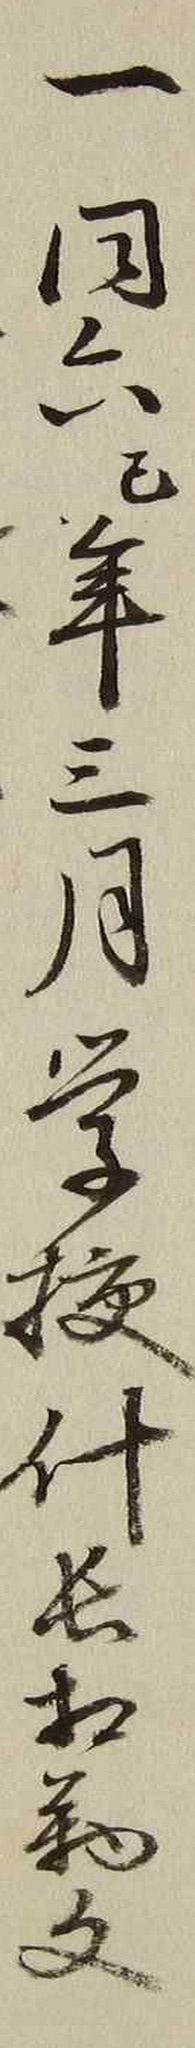一同六巳年三月学校什長相勤文
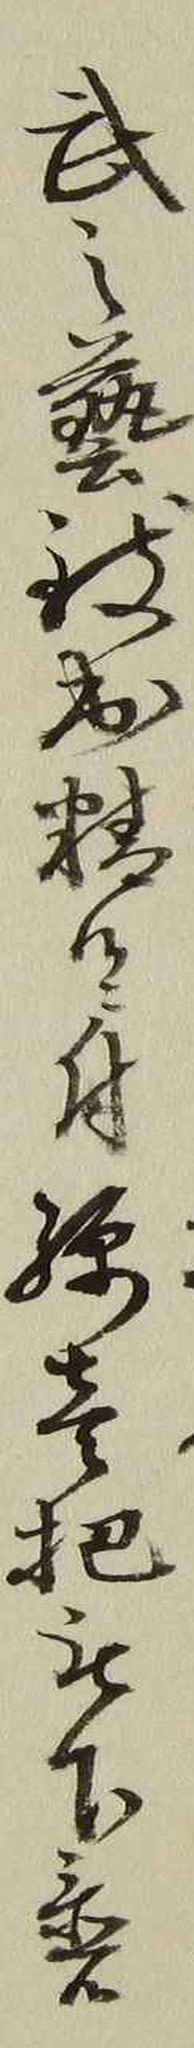武之芸致出精候ニ付綿壱把被下置候
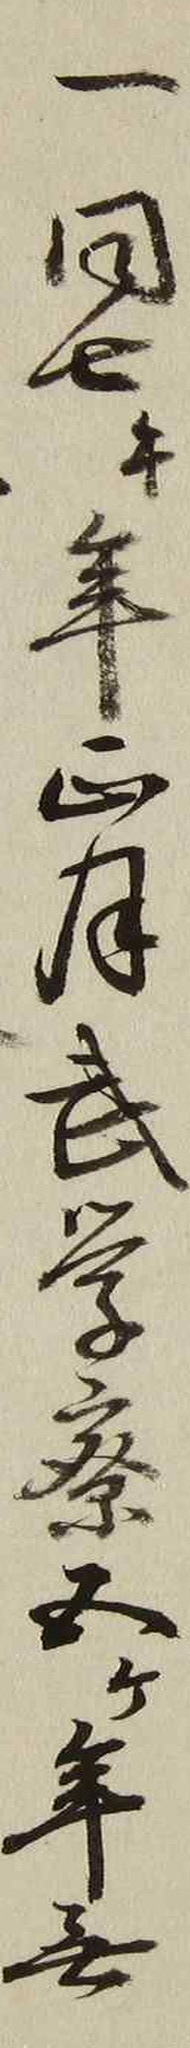一同七午年正月武学寮五ケ年無
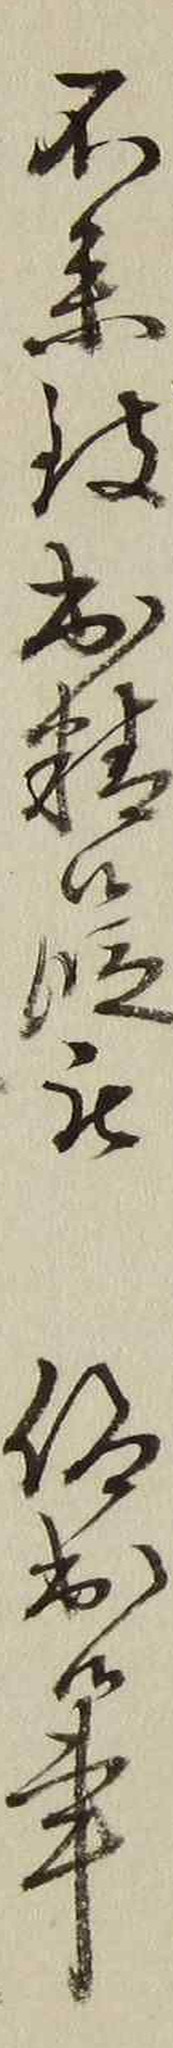不参致出精候段被仰出候事
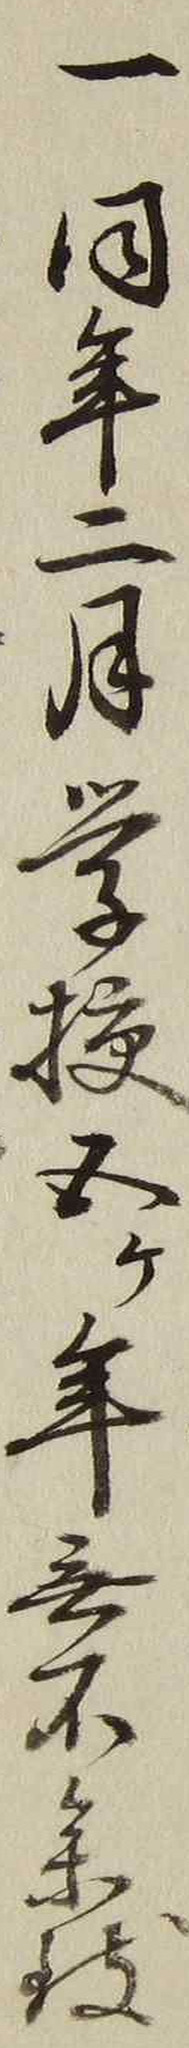一同年二月学校五ケ年無不参致
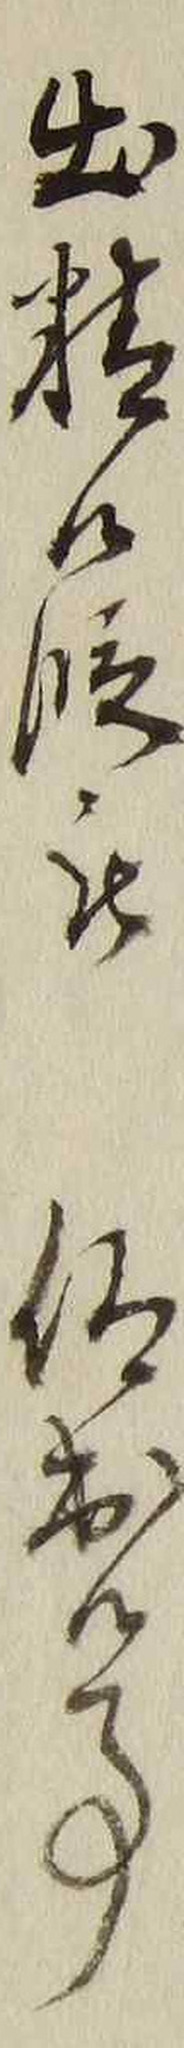出精候段被仰出候事
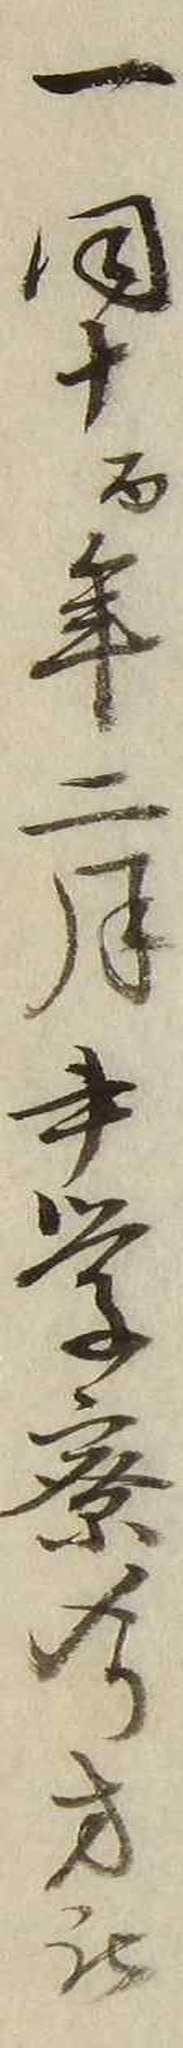一同十酉年二月書学寮〆り方被

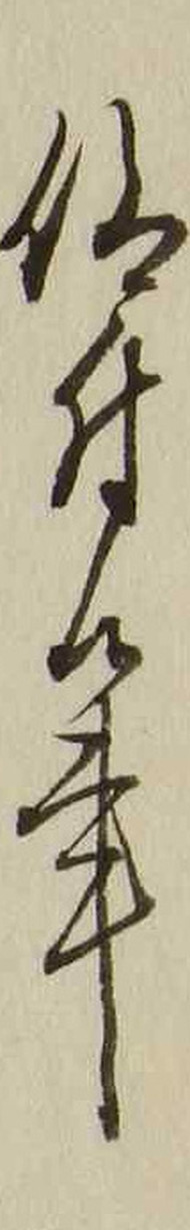仰付候事
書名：諸士系譜　巻之35　は之部3
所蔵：会津若松市立会津図書館
